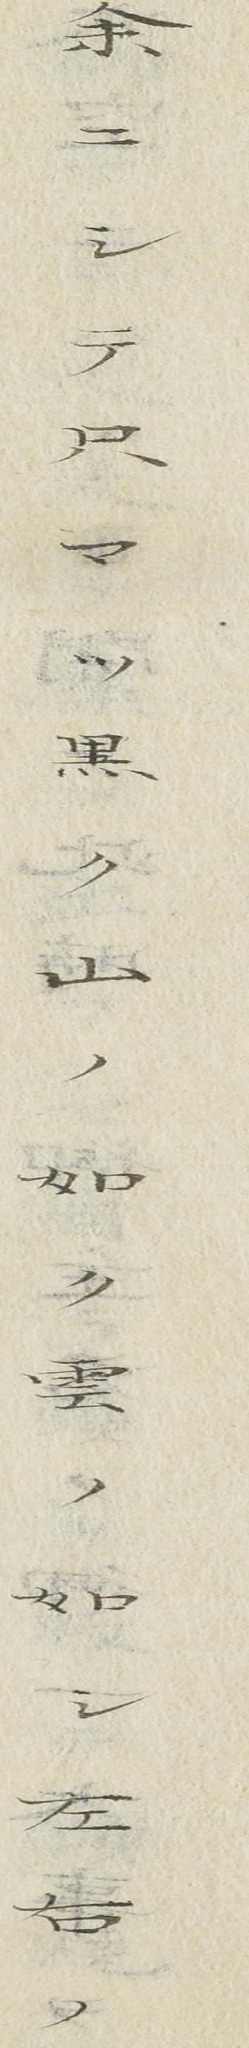余ニシテ只マツ黒ク山ノ如ク曇ノ如シ左右ノ
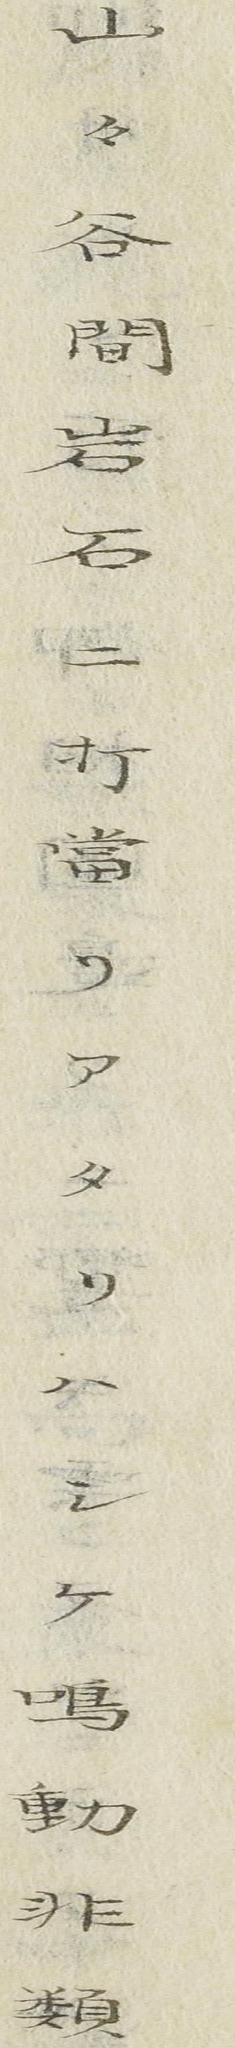山々谷間岩石ニ打当リアタリハシケ鳴動非類
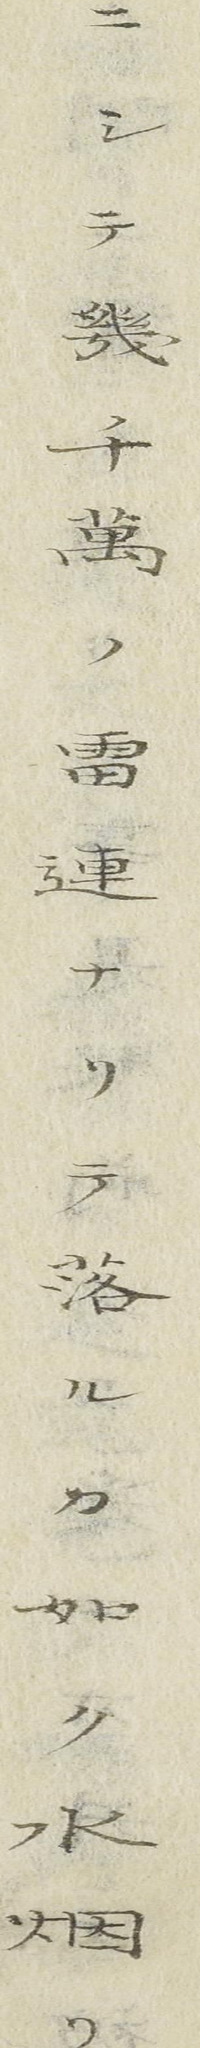ニシテ幾千万ノ雷連ナリテ落ルカ如ク水烟リ
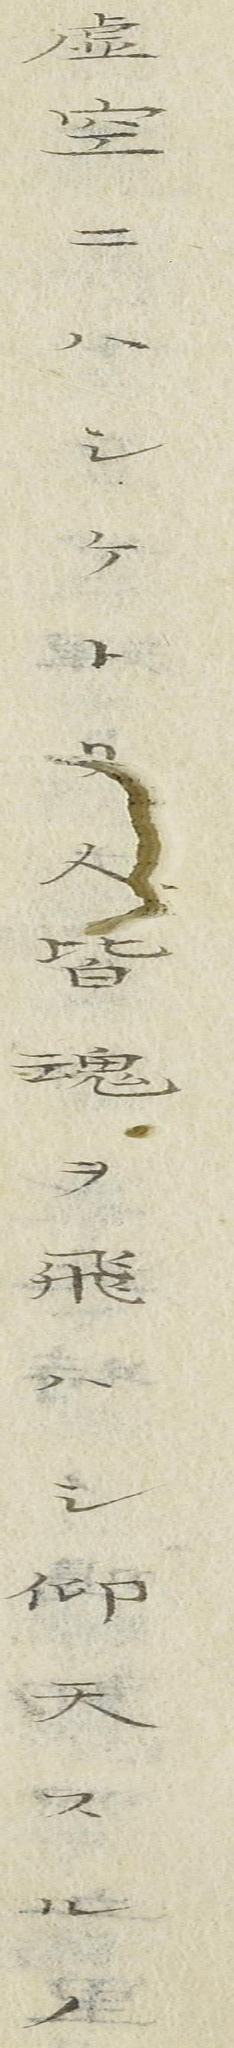虚空ニハシケトリ人皆魂ヲ飛ハシ仰天スルノ

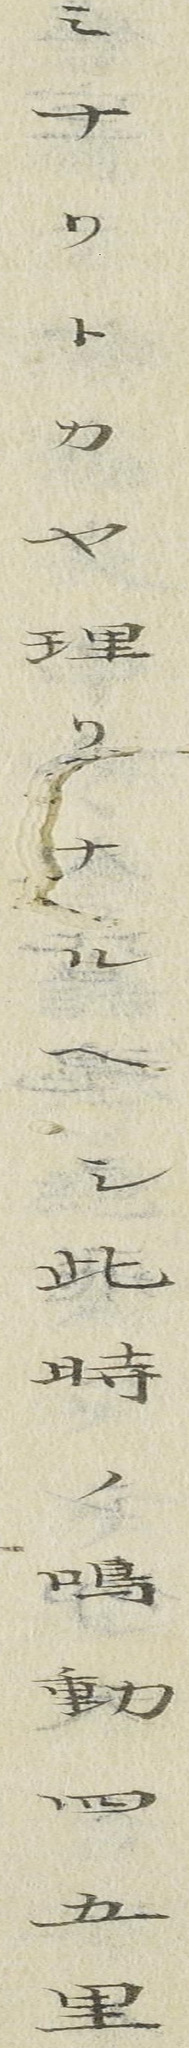ミナリトカヤ理リナルヘシ此時ノ鳴動四五里
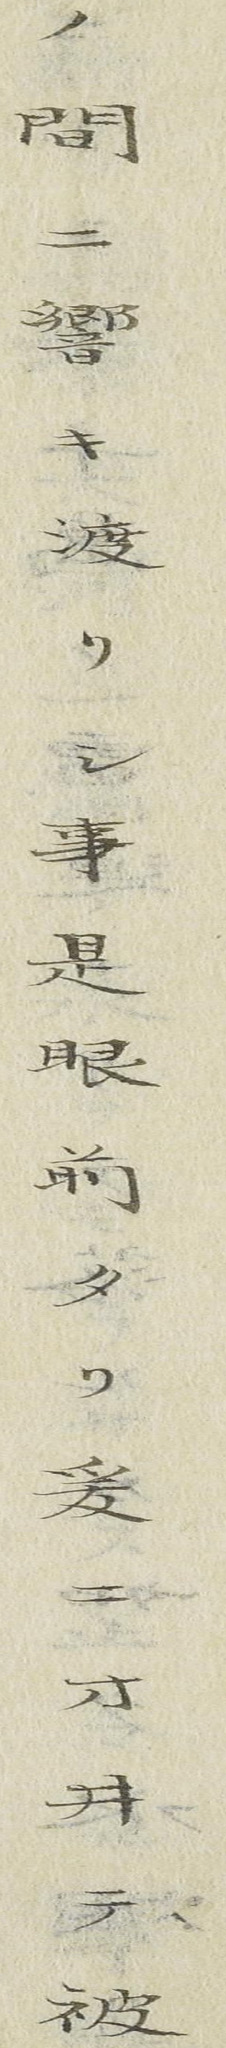ノ間ニ響キ渡リシ事是眼前タリ爰ニオヰテ被
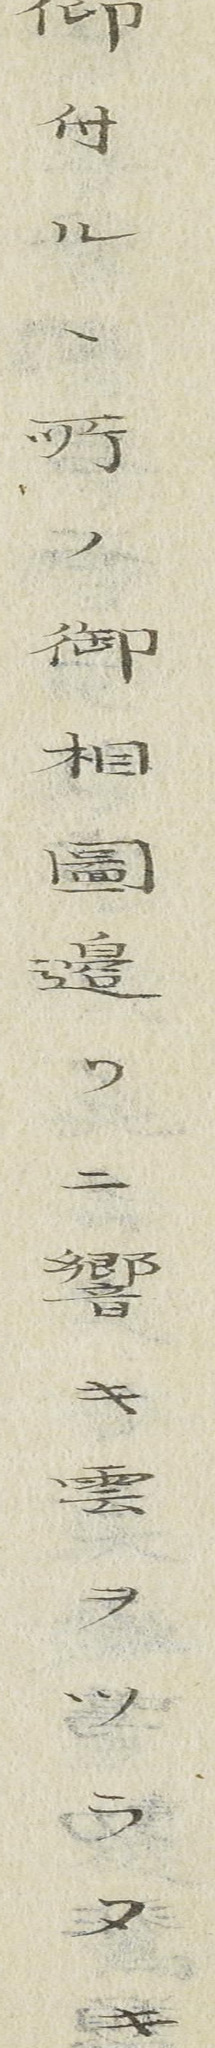仰付ルヽ所ノ御相図辺リニ響キ曇ヲツラヌキ
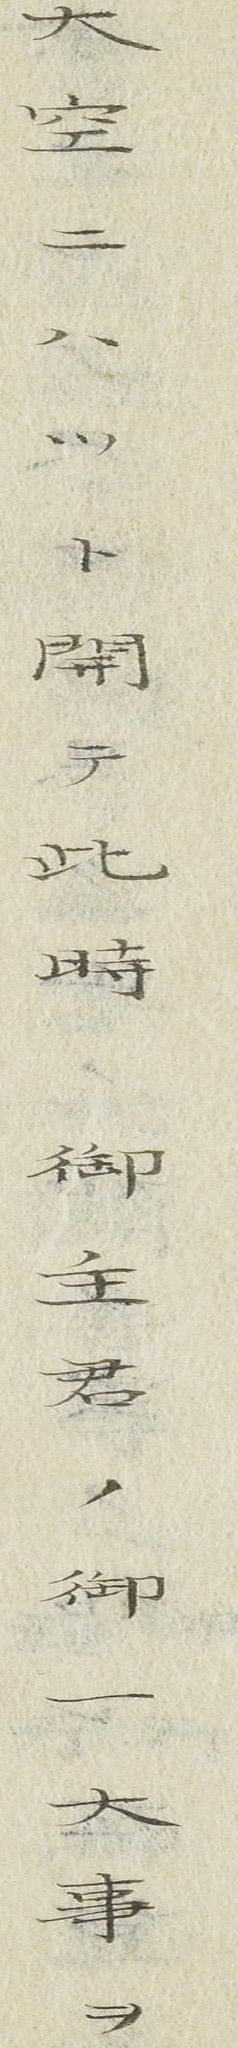大空ニハツト開テ此時御主君ノ御一大事ヲ
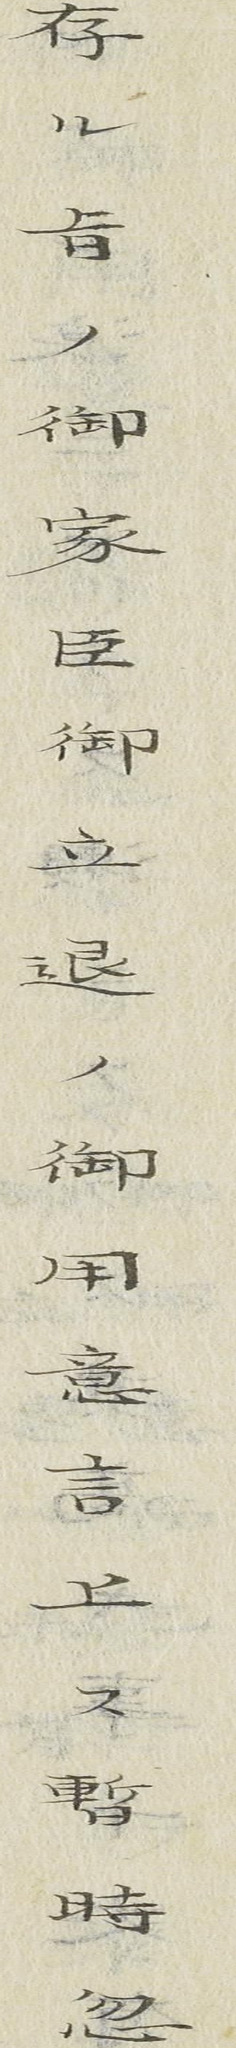存ル旨ノ御家臣御立退ノ御用意言上ス暫時忽
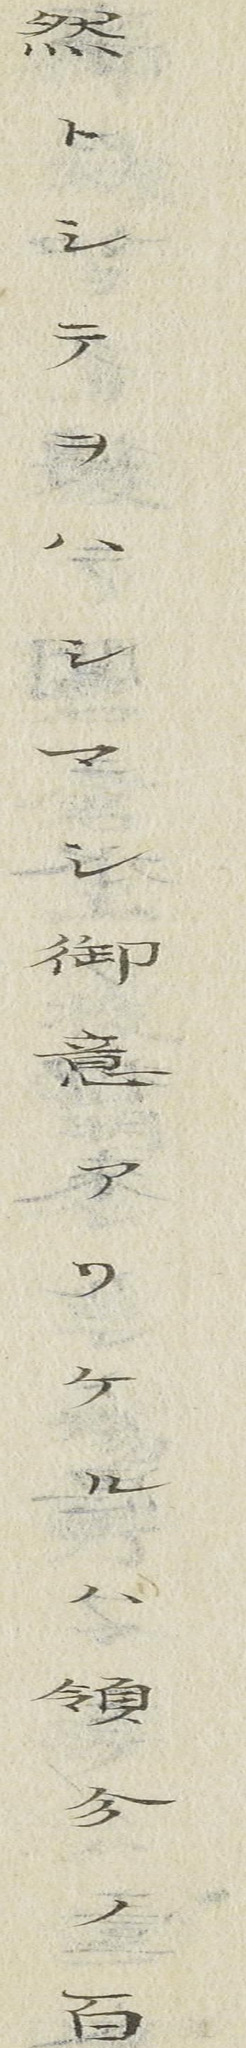然トシテヲハシマシ御意アリケルハ領分ノ百
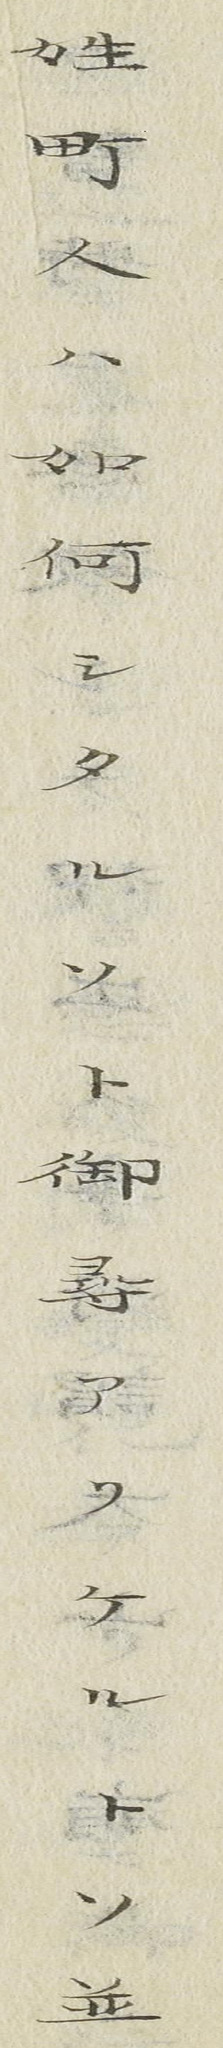姓町人ハ如何シタルソト御尋アリケルトソ並
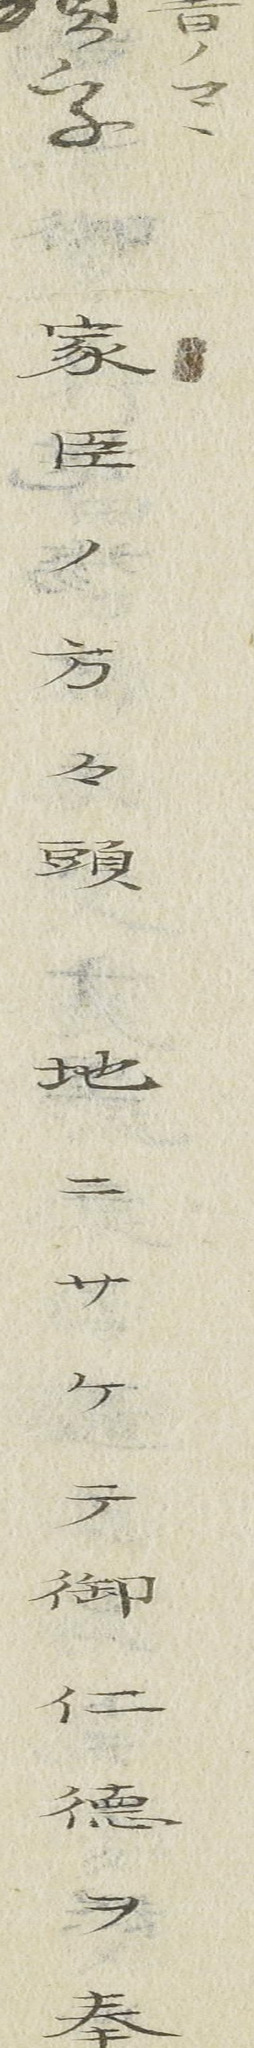家臣ノ方々頭地ニサケテ御仁徳ヲ奉
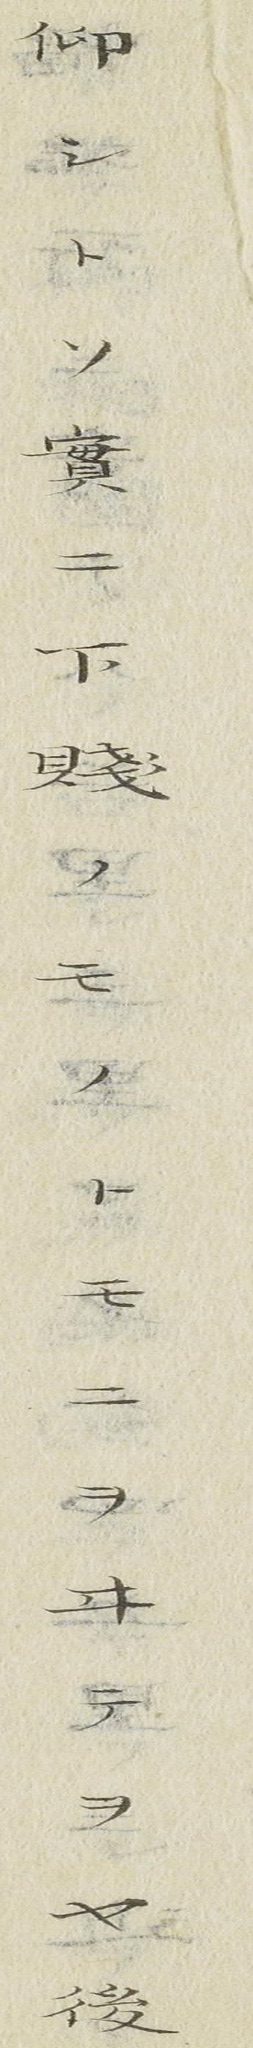仰シトソ実ニ下賤ノモノトモニヲヰテヲヤ後
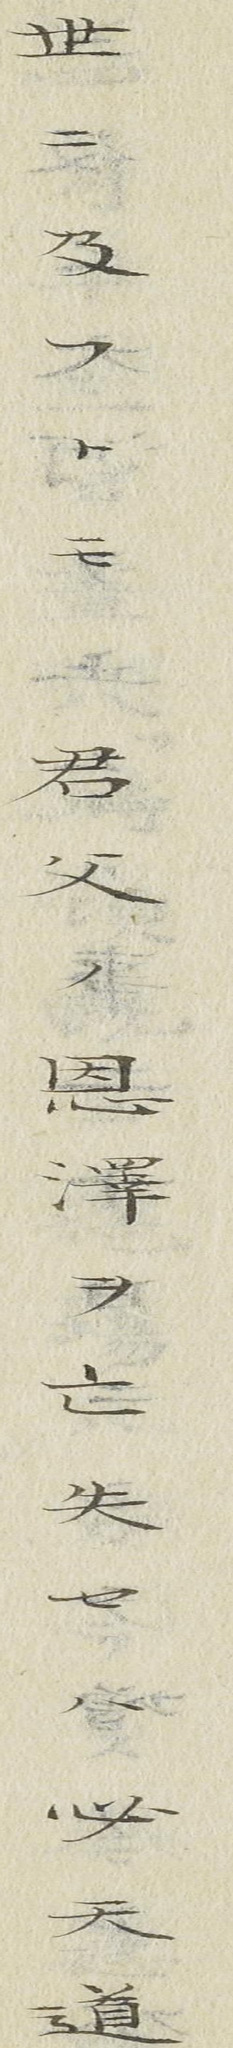世ニ及フトモ君父ノ恩沢ヲ亡失セハ必天道
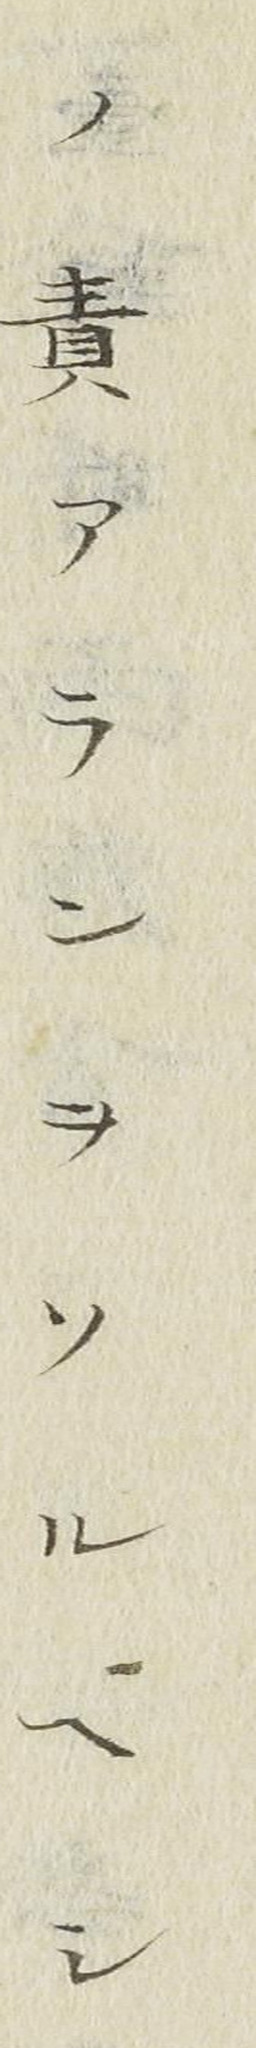ノ責アランヲソルヘシ
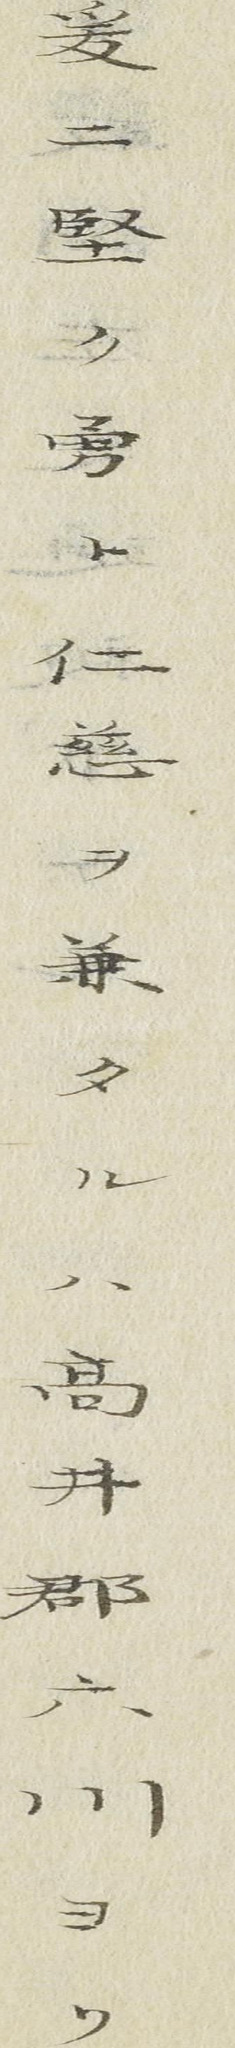爰ニ堅ク勇ト仁慈ヲ兼タルハ高井郡六川ヨリ
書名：地災撮要　地震之部　巻ノ二
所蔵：東京大学地震研究所図書室 Earthquake Research Institute Library, The University of Tokyo, JAPAN
